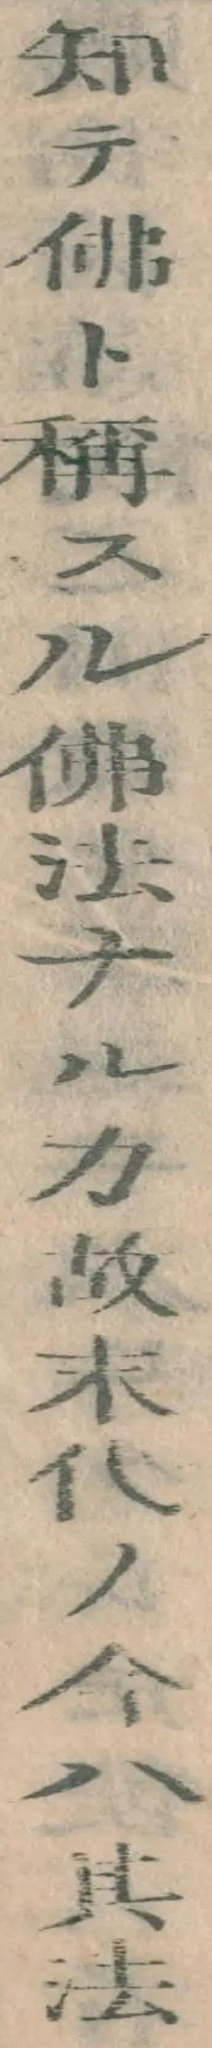知テ仏ト称スル仏法ナルカ故末代ノ今ハ其法
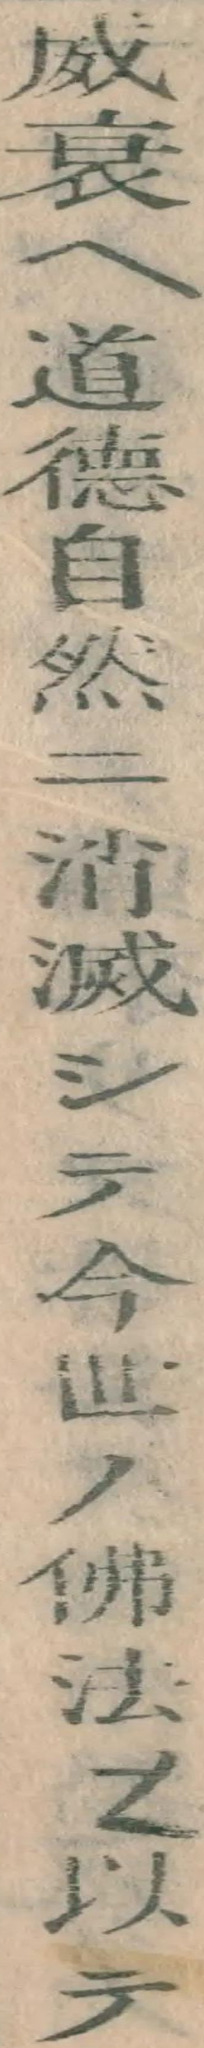威衰ヘ道徳自然ニ消滅シテ今世ノ仏法ヲ以テ
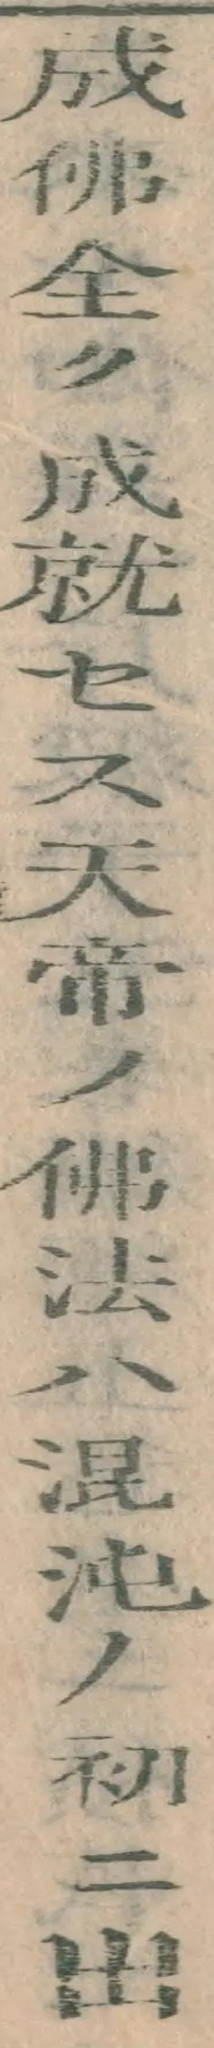成仏全ク成就セス天帝ノ仏法ハ混沌ノ初ニ出
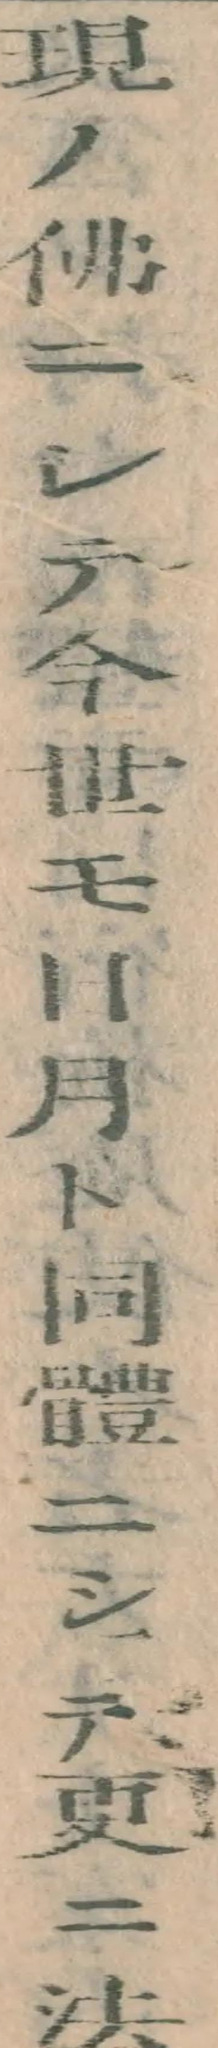現ノ仏ニシテ今世モ日月ト同体ニシテ更ニ法
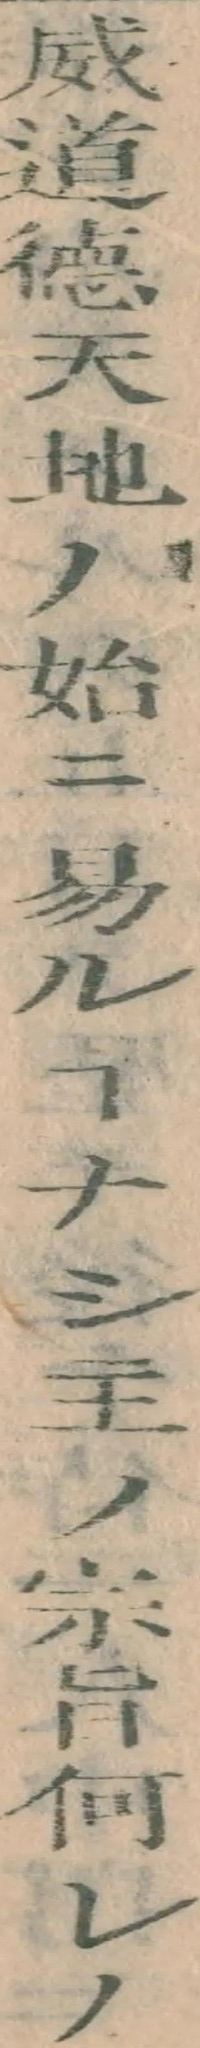威道徳天地ノ始ニ易ルヿナシ主ノ宗旨何レノ
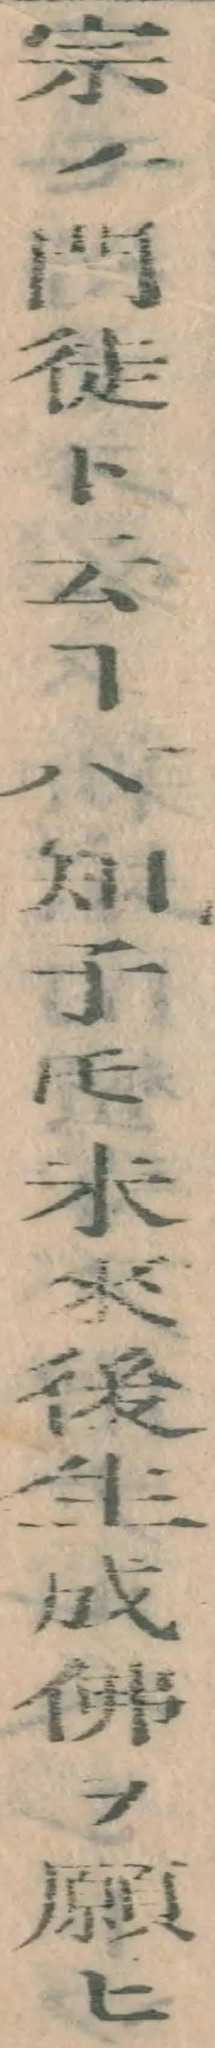宗ノ門徒ト云ヿハ知ネトモ未来後生成仏ヲ願ヒ
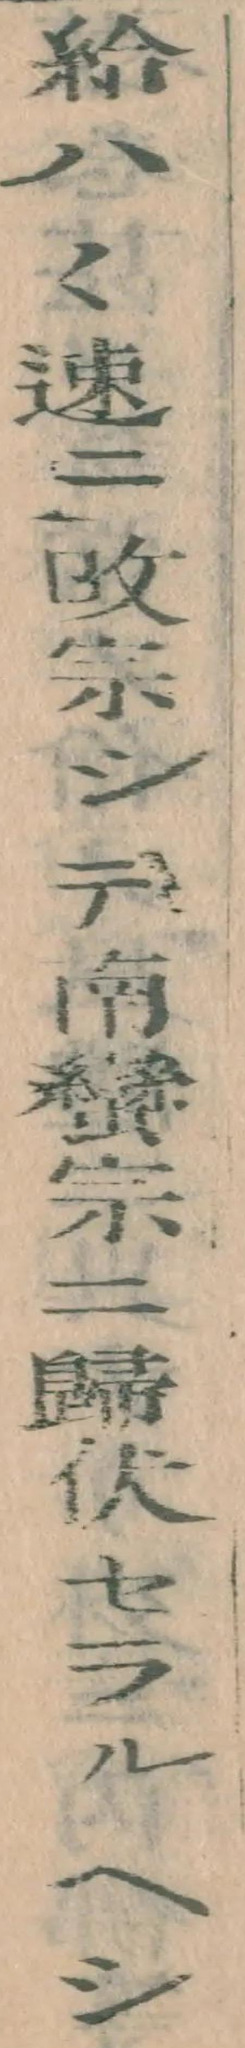給ハ〱速ニ改宗シテ南蛮宗ニ帰伏セラルヘシ
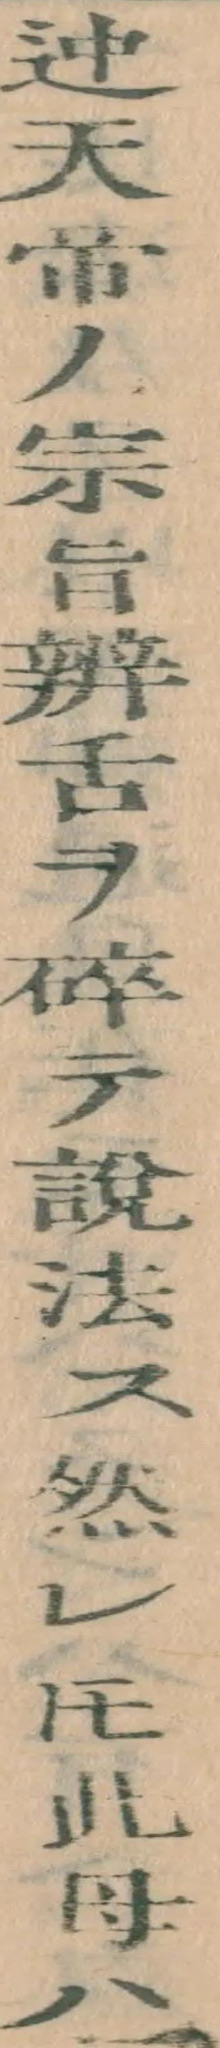迚天帝ノ宗旨弁舌ヲ砕テ説法ス然レトモ此母ハ
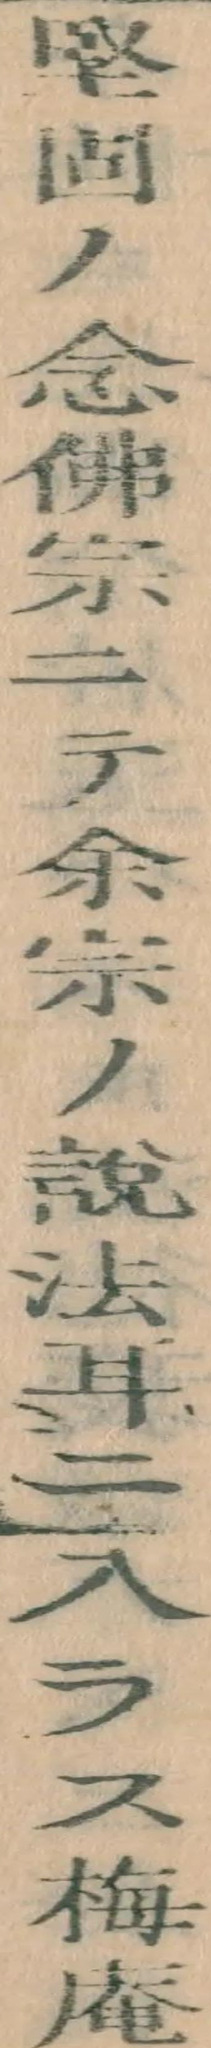堅固ノ念仏宗ニテ余宗ノ説法耳ニ入ラス梅庵
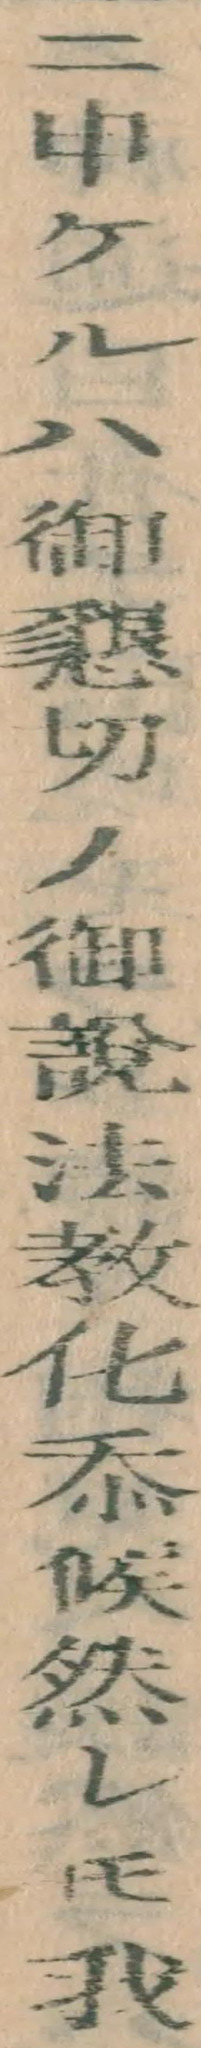ニ申ケルハ御懇切ノ御説法教化忝候然レトモ我
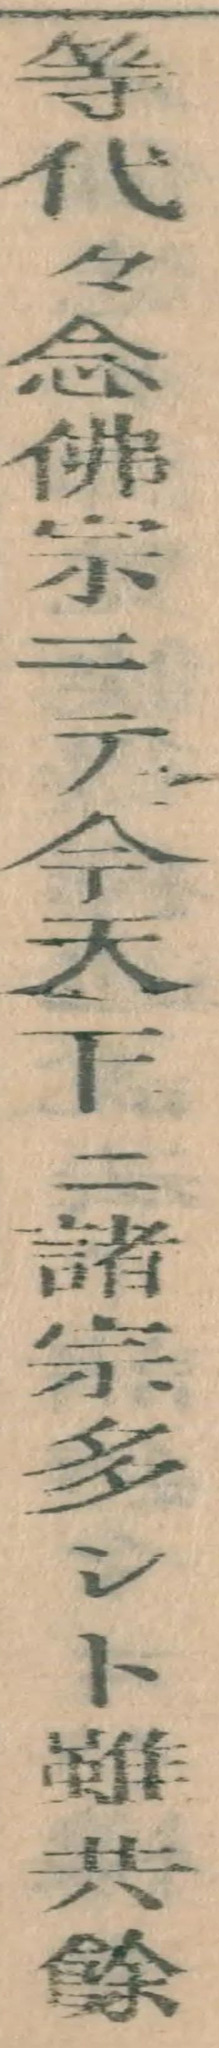等代々念仏宗ニテ今天下ニ諸宗多シト雖共余
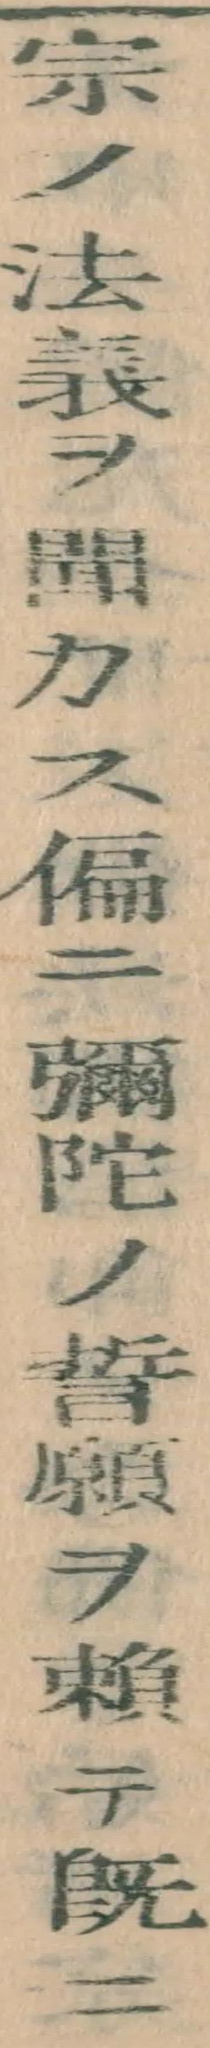宗ノ法義ヲ聞カス偏ニ弥陀ノ誓願ヲ頼テ既ニ
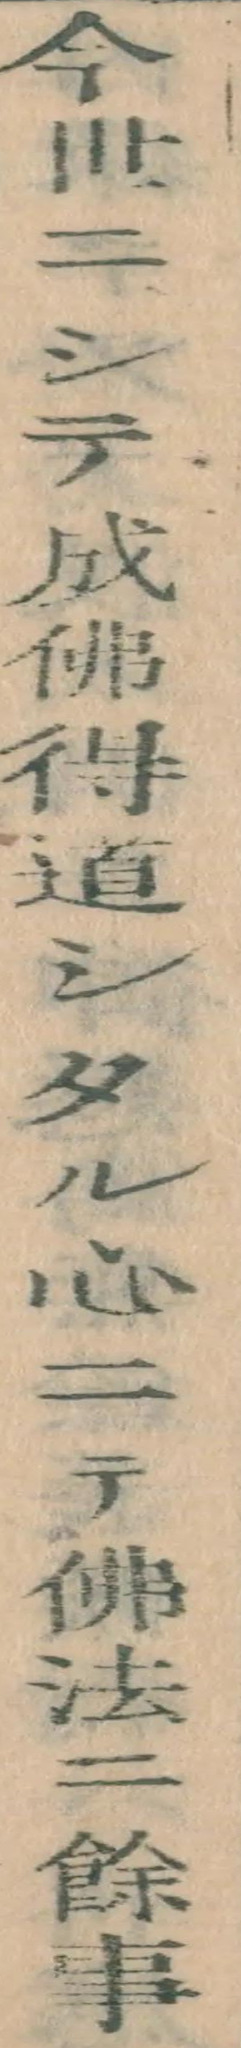今世ニシテ成仏得道シタル心ニテ仏法ニ余事
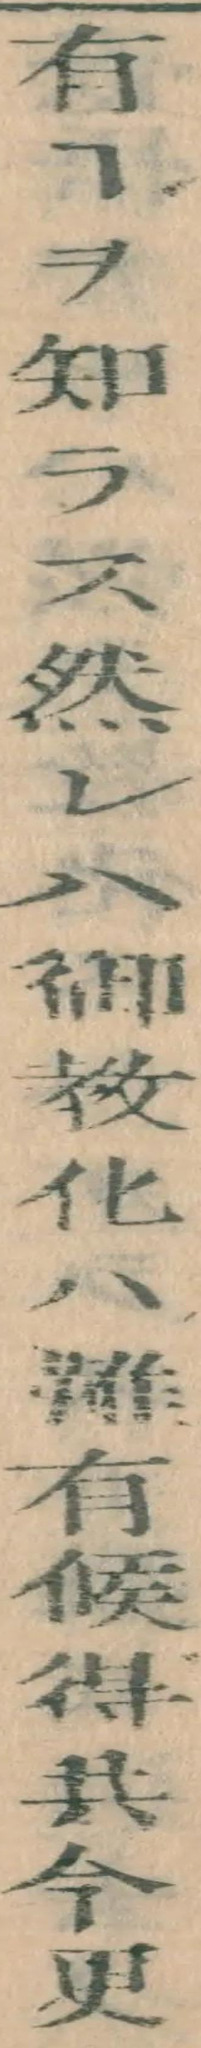有ヿヲ知ラス然レハ御教化ハ難有候得共今更
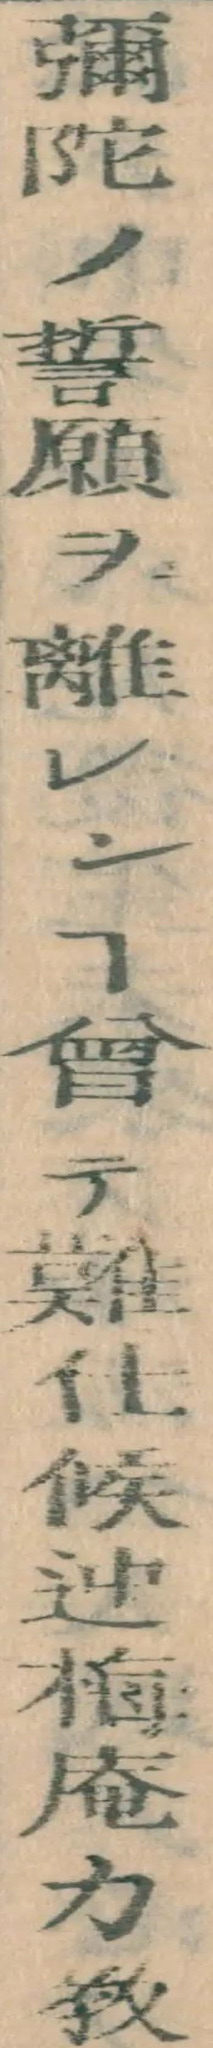弥陀ノ誓願ヲ離レンヿ曽テ難仕候迚梅庵カ教
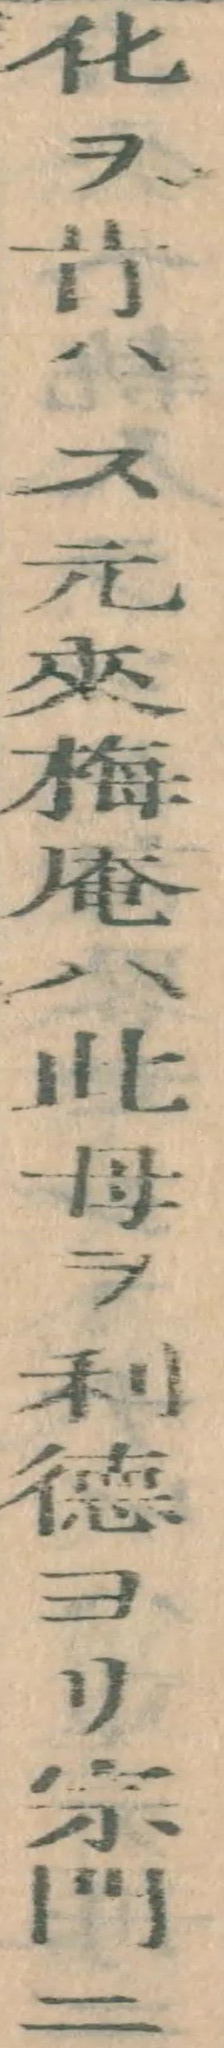化ヲ肯ハス元来梅庵ハ此母ヲ利徳ヨリ宗門ニ
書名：南蛮寺興廃記
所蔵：国立国会図書館 National Diet Library, JAPAN
